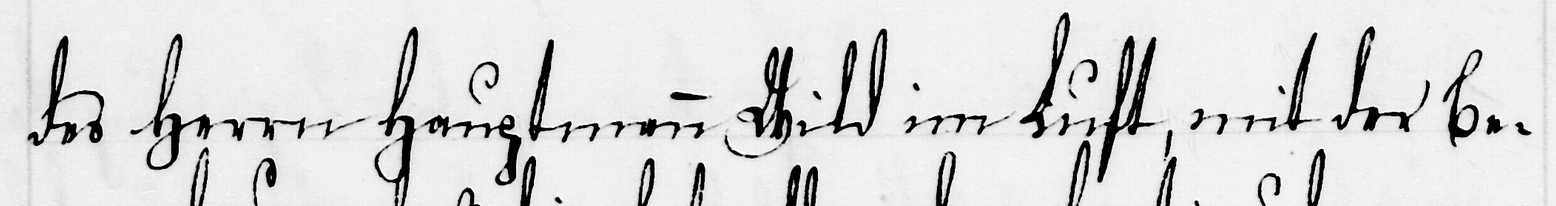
des Herrn Hauptmann Wild im Luft, mit der Be¬
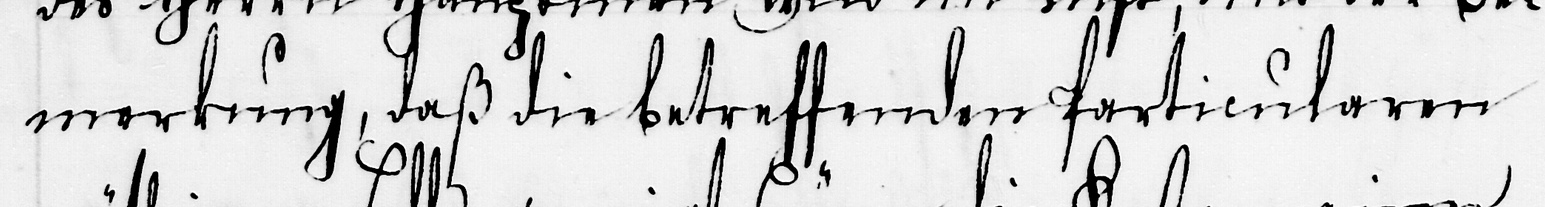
merkung, daß die betreffenden Particularen
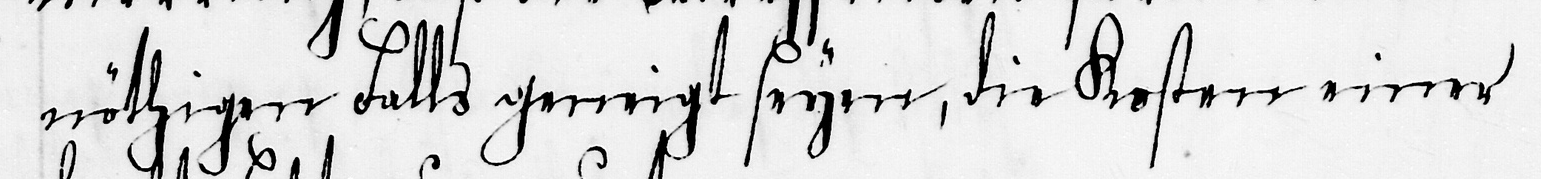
nöthigen Falls geneigt seyen, die Kosten einer
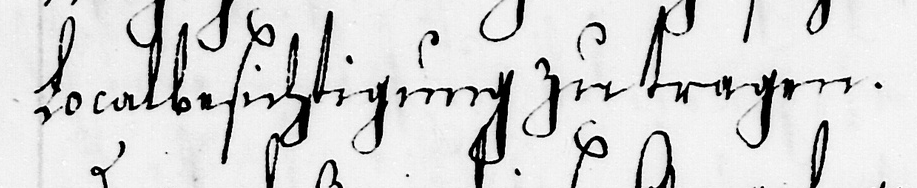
Localbesichtigung zu tragen.
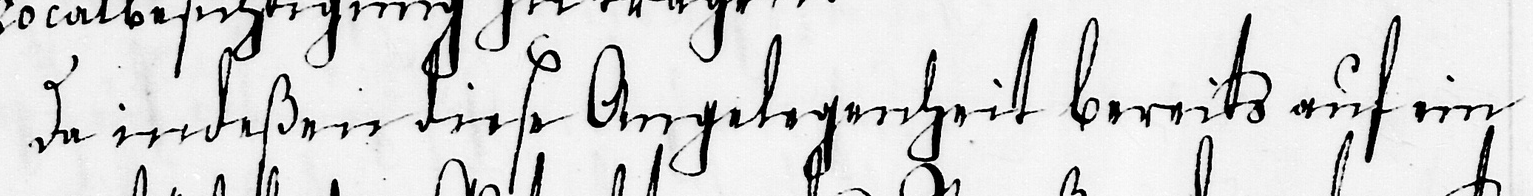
Da indeßen diese Angelegenheit bereits auf ein
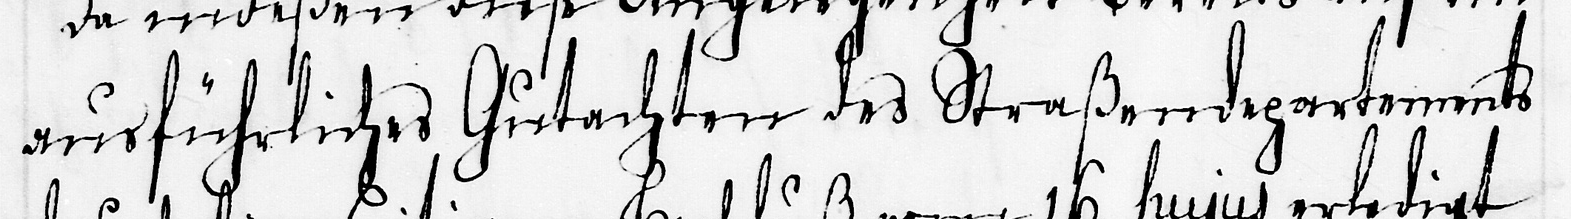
ausführliches Gutachten des Straßendepartements
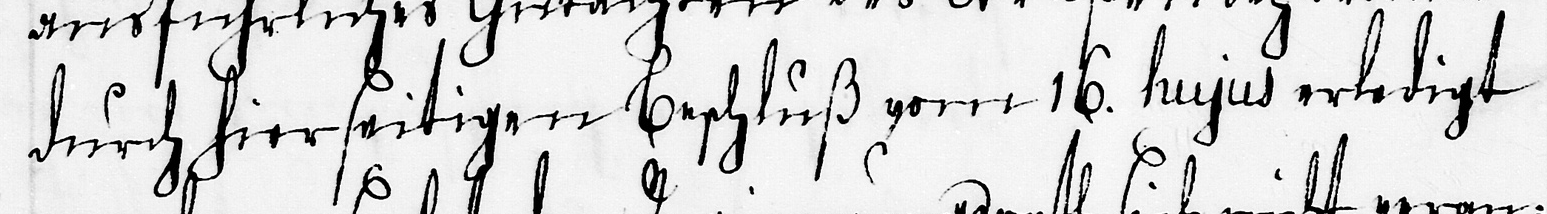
durch hierseitigen Beschluß vom 16. hujus erledigt
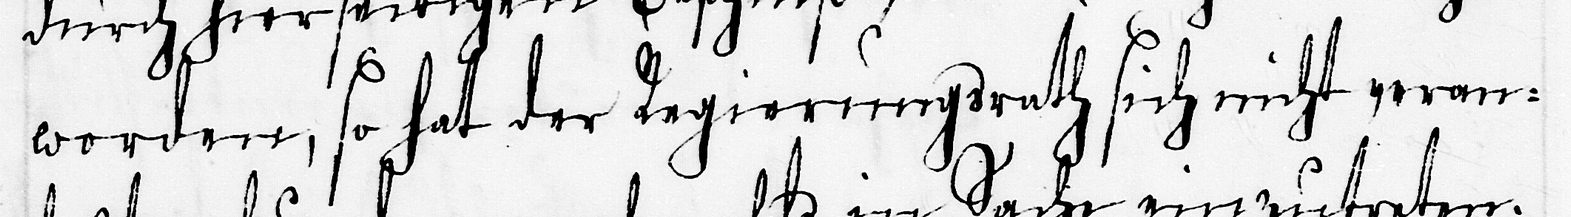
worden, so hat der Regierungsrath sich nicht veran¬
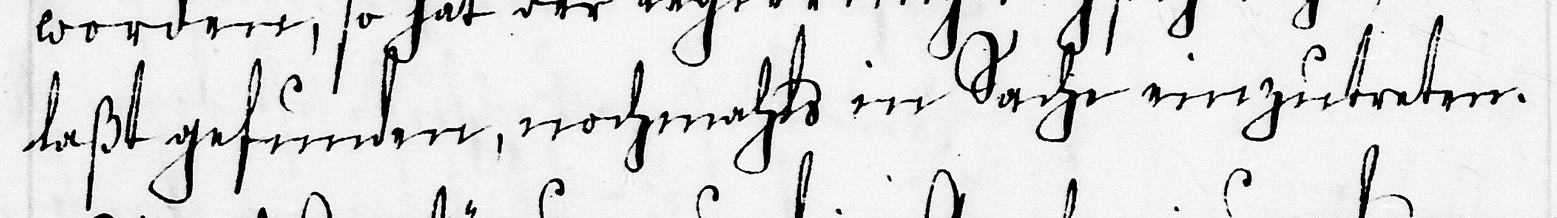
laßt gefunden, nochmahls in Sache einzutreten.
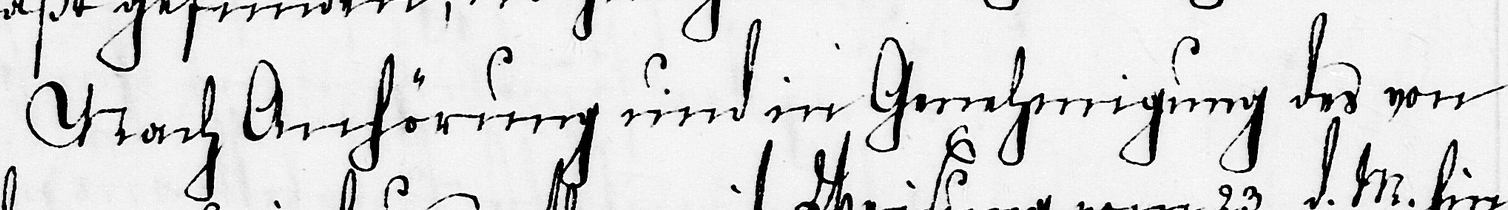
Nach Anhörung und in Genehmigung des von
